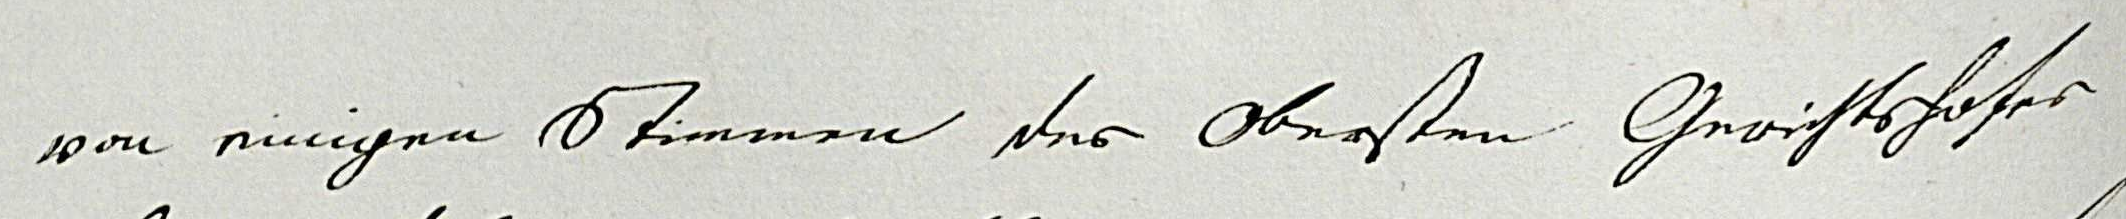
von einigen Stimmen des Obersten Gerichtshofes
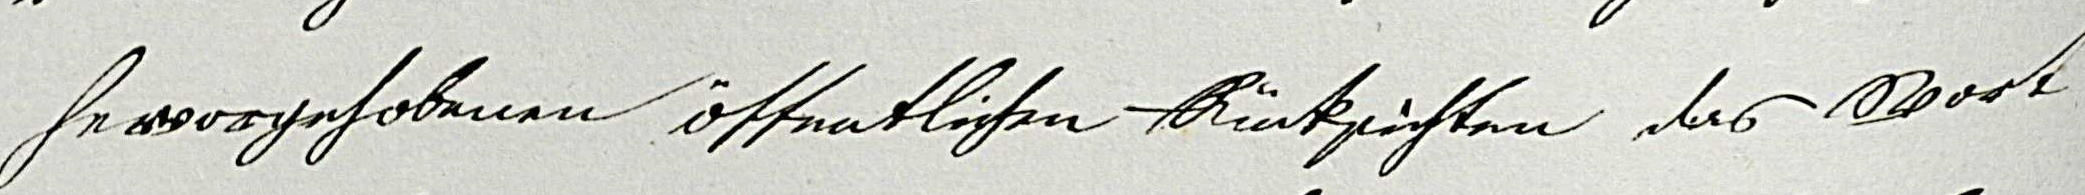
hervorgehobenen öffentlichen Rücksichten das Wort
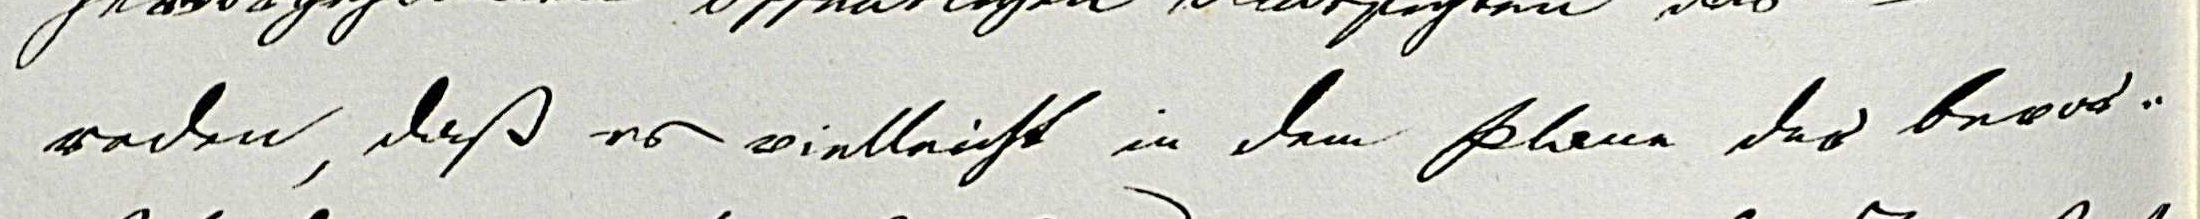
reden, daß es vielleicht in dem Plane der bevor¬
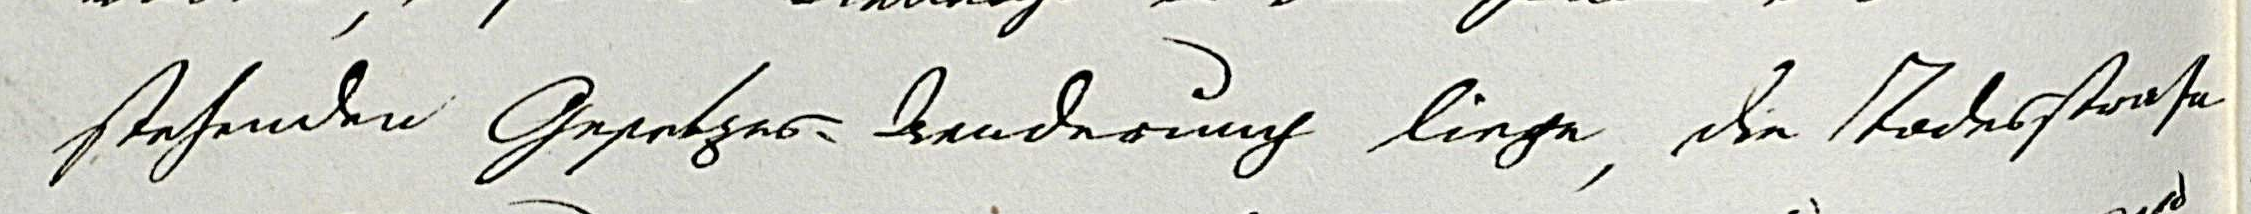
stehende Gesetzes Aenderung liege, die Todesstrafe
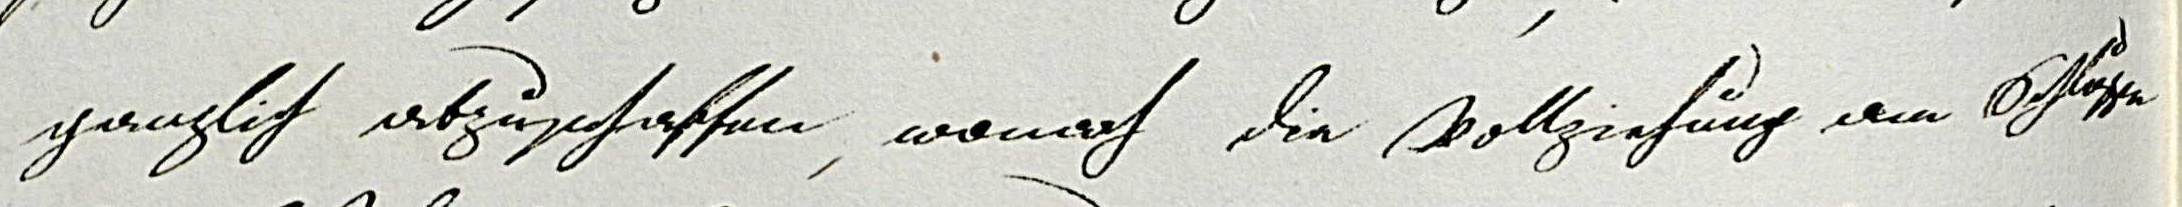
ganzlich abzuschaffen, wonach die Vollziehung am Schlüsse
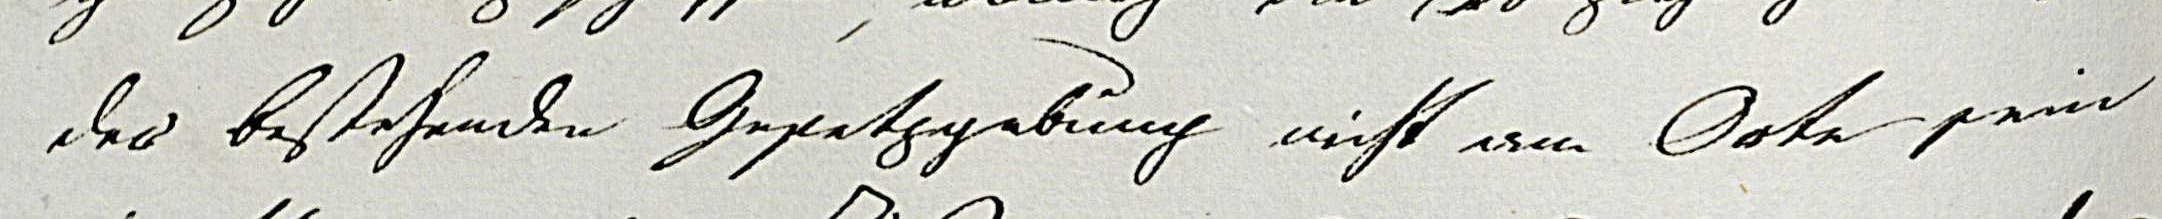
der Bestehenden Gesetzgebung nicht am Orte sein
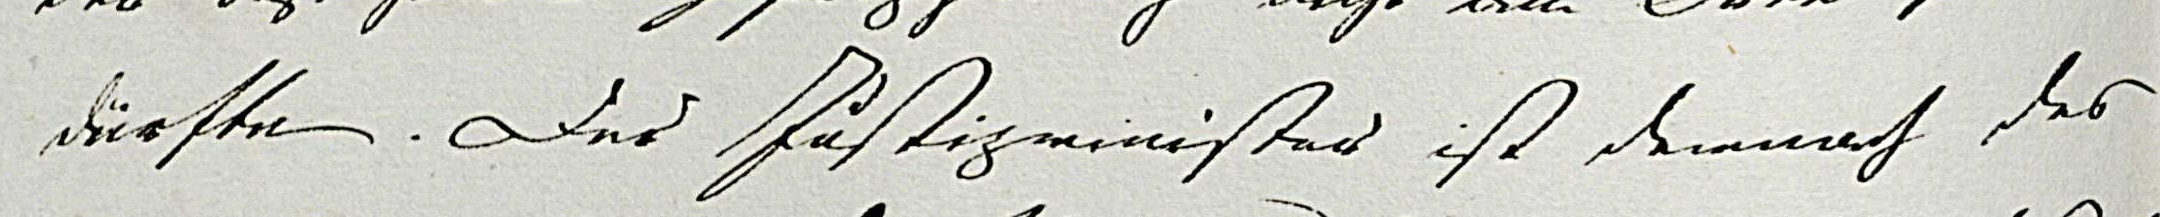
dürfte. Der Justizminister ist demnach des
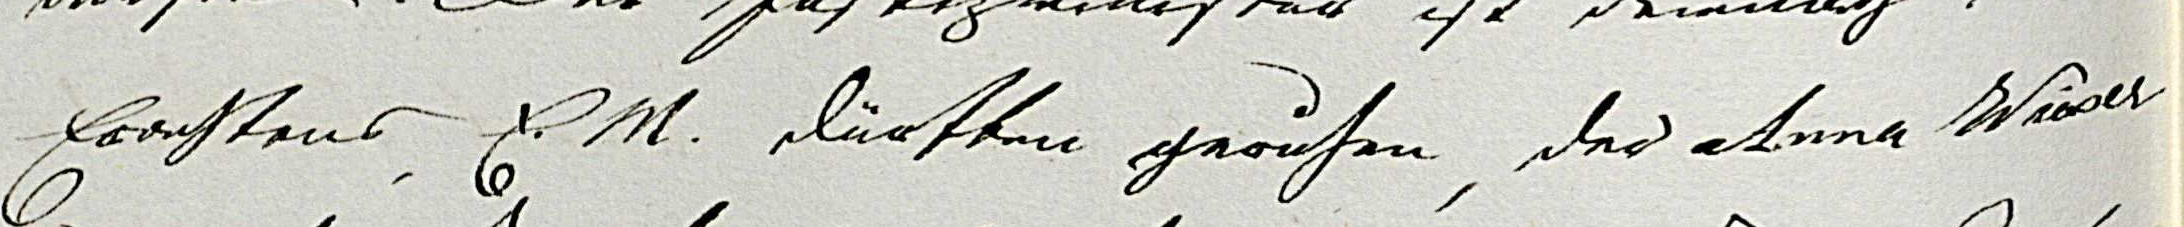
Erachtens, E.M. dürften geruhen, der Anna Wieser
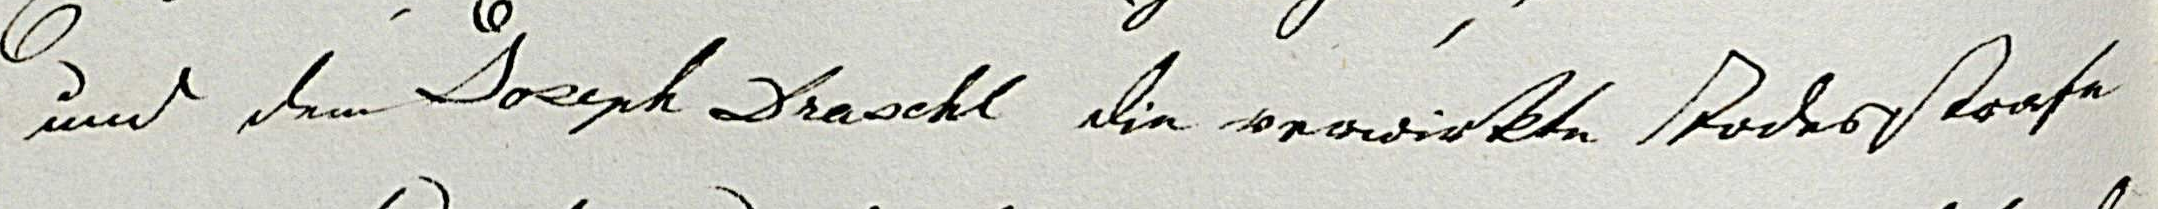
und dem Joseph Draschl die verwirkte Todesstrafe
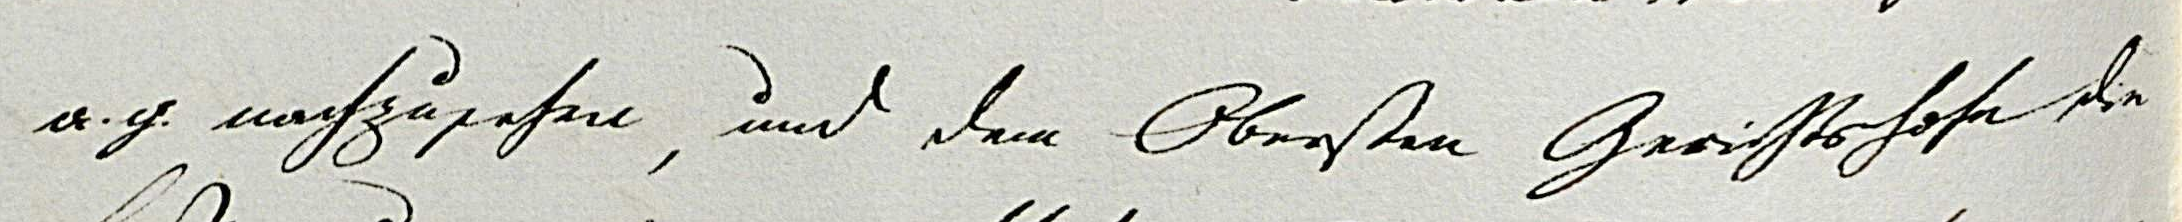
a.g. nachzusehen, und dem Obersten Gerichtshofe die
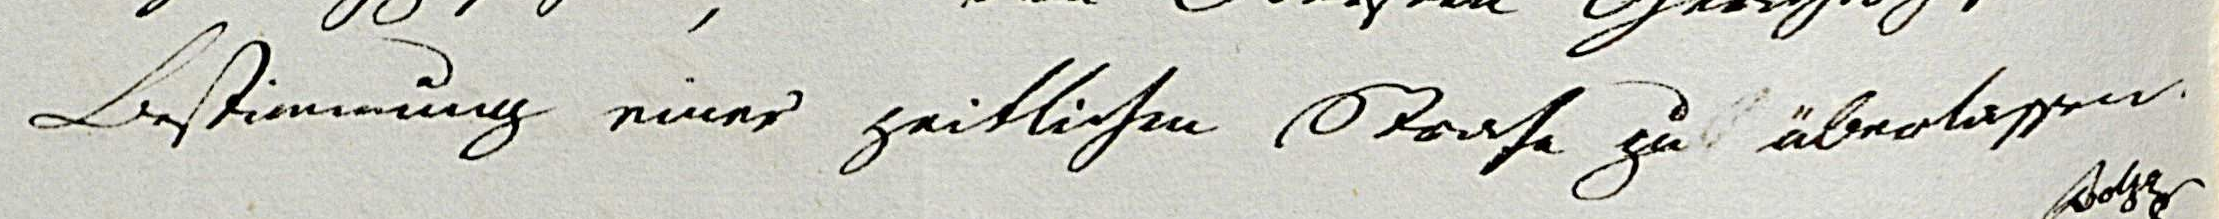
Bestimmung einer zeitlichen Strafe zu überlassen.
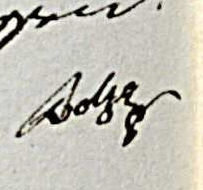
Bolza
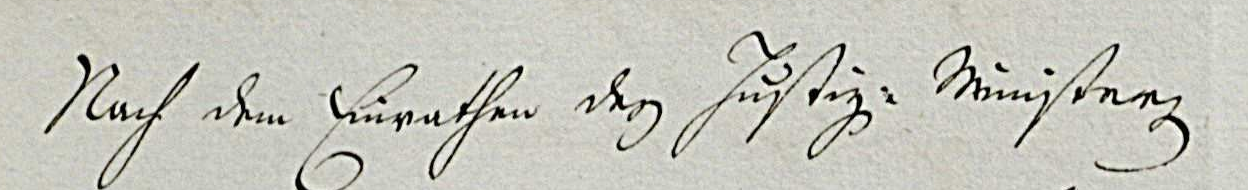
Nach dem Einrathen des Justiz:Ministers
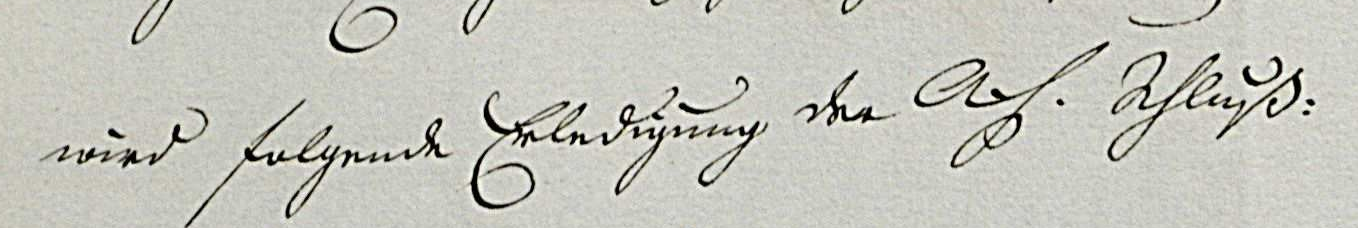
wird folgende Erledigung der Ah. Schluß¬
